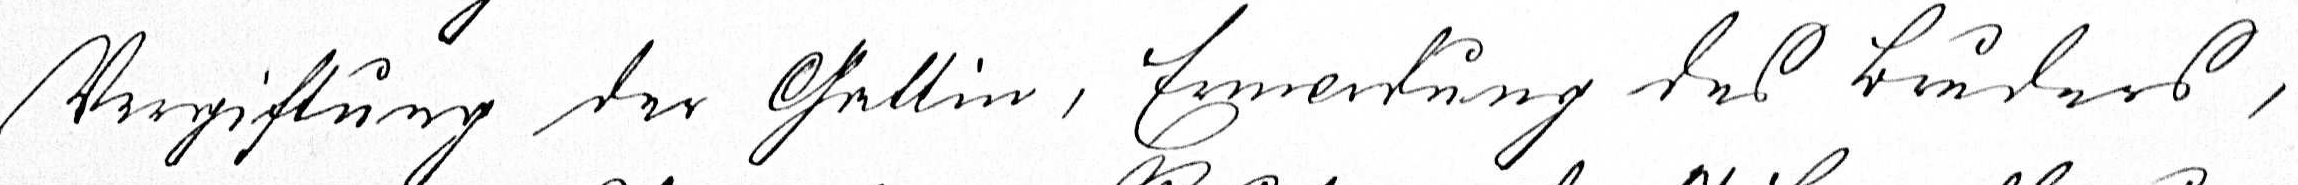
Vergiftung der Gattin, Ermordung des Bruders,
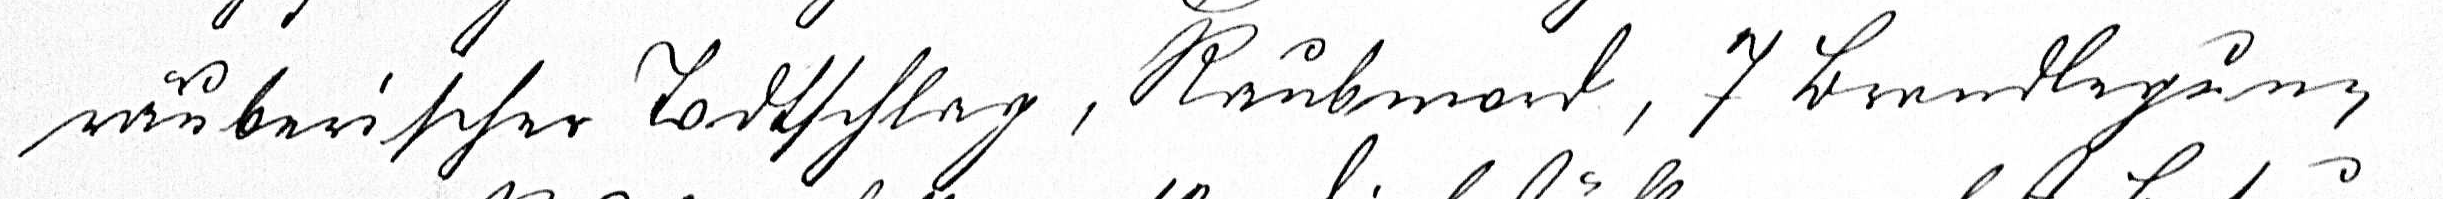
räuberischer Todtschlag, Raubmord, 7 Brandlegun¬
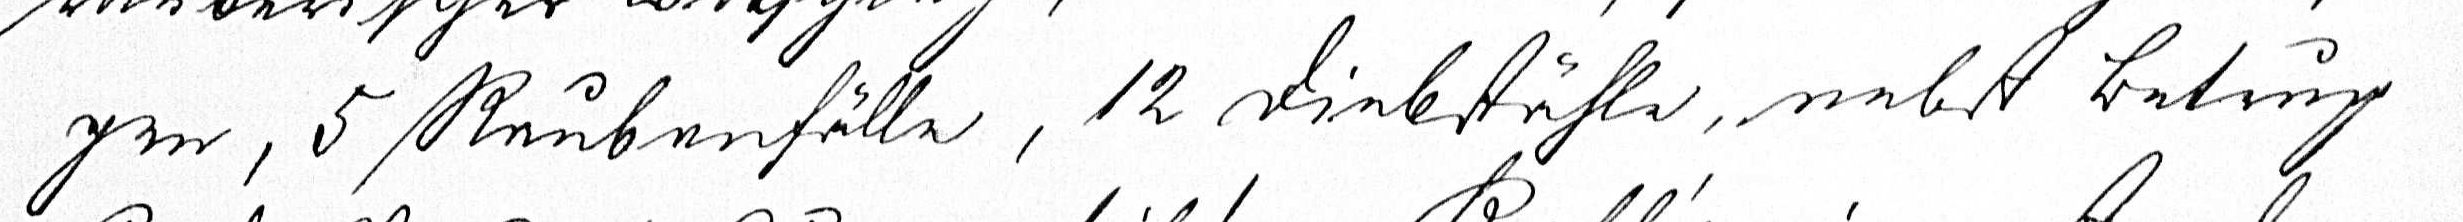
gen, 5 Raubenfälle, 12 Diebstähle, nebst Betrug
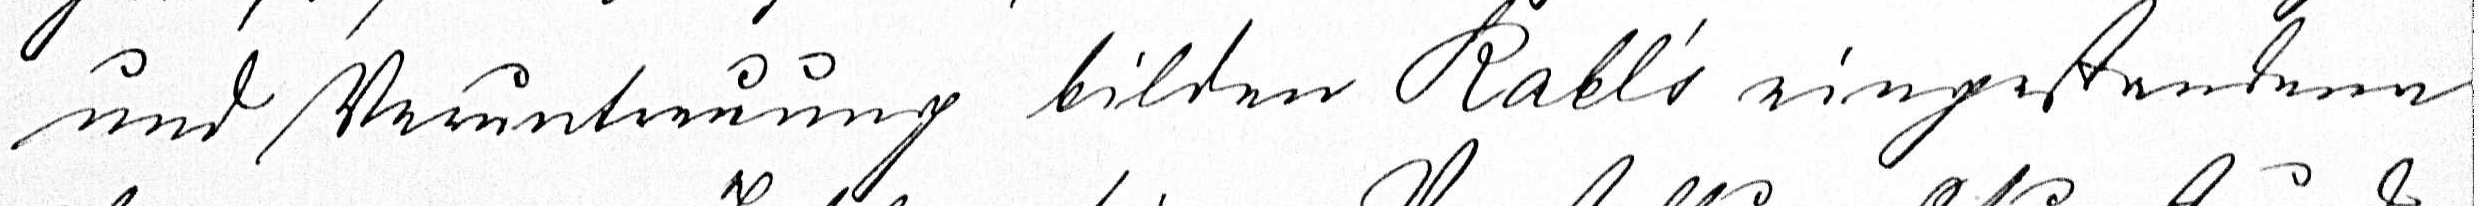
und Veruntreuung bilden Rabl's eingestandene
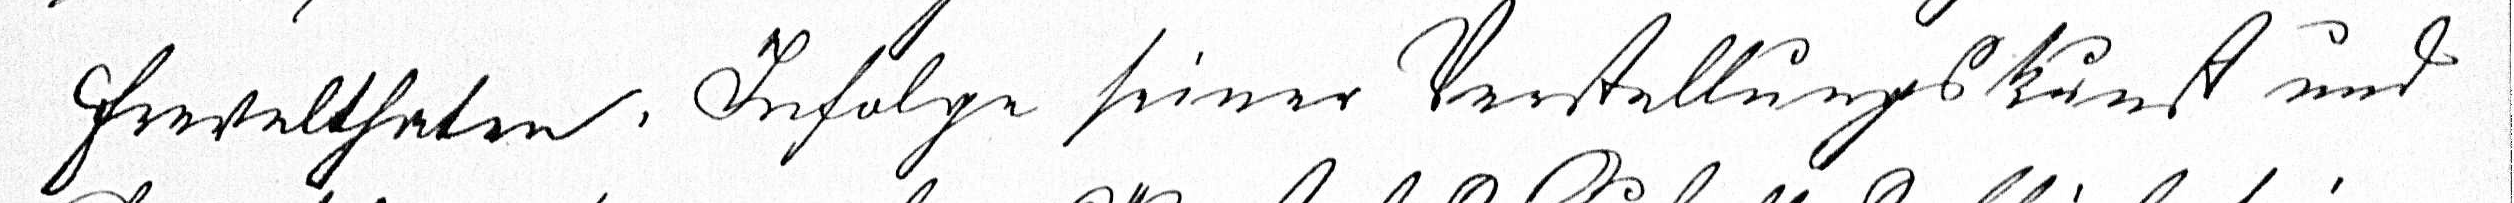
Frevelthaten. Infolge seiner Verstellungskunst und
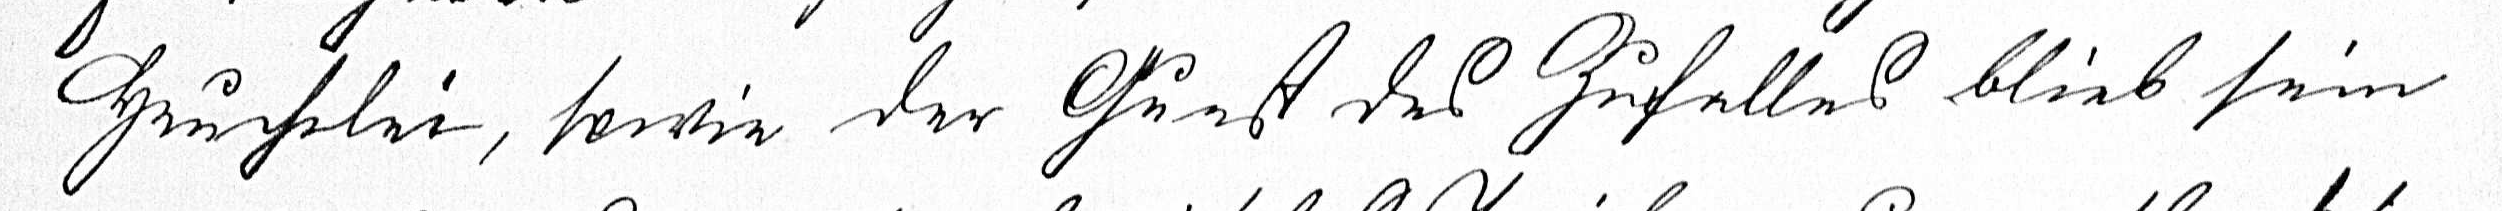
Heuchelei, sowie der Gunst des Zufalles blieb sein
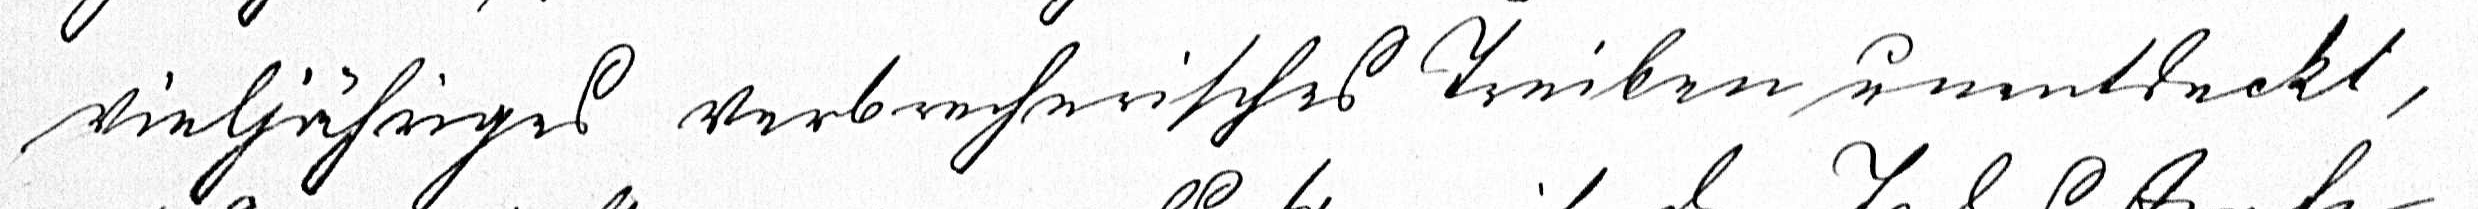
vieljähriges verbrecherisches Treiben unentdeckt,
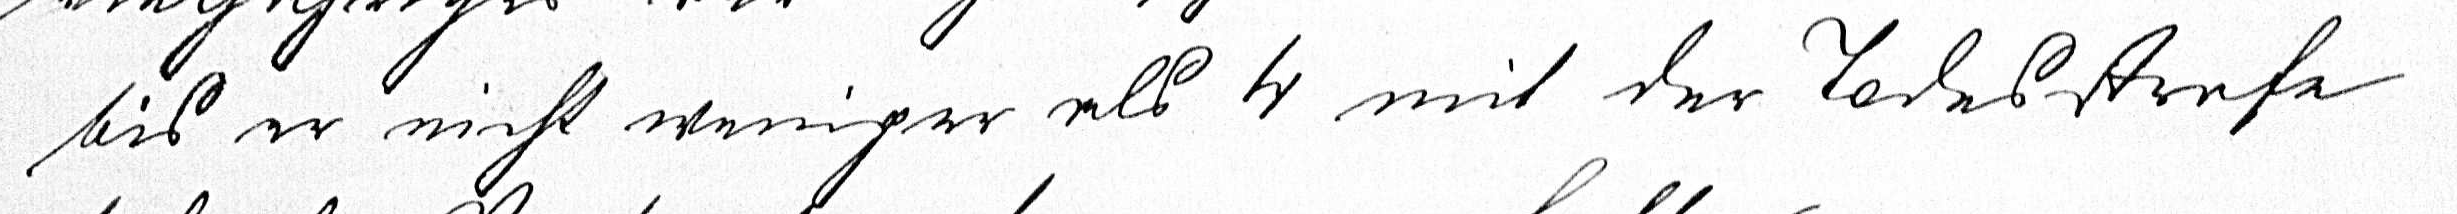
bis er nicht weniger als 4 mit der Todesstrafe
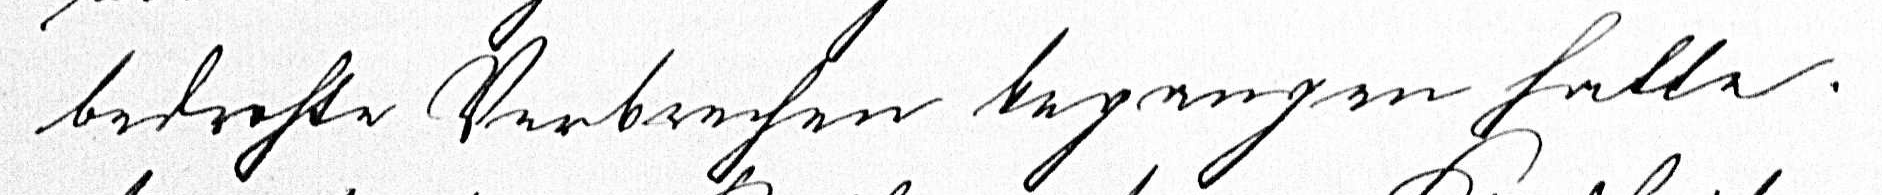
bedrehte Verbrechen begangen hatte.
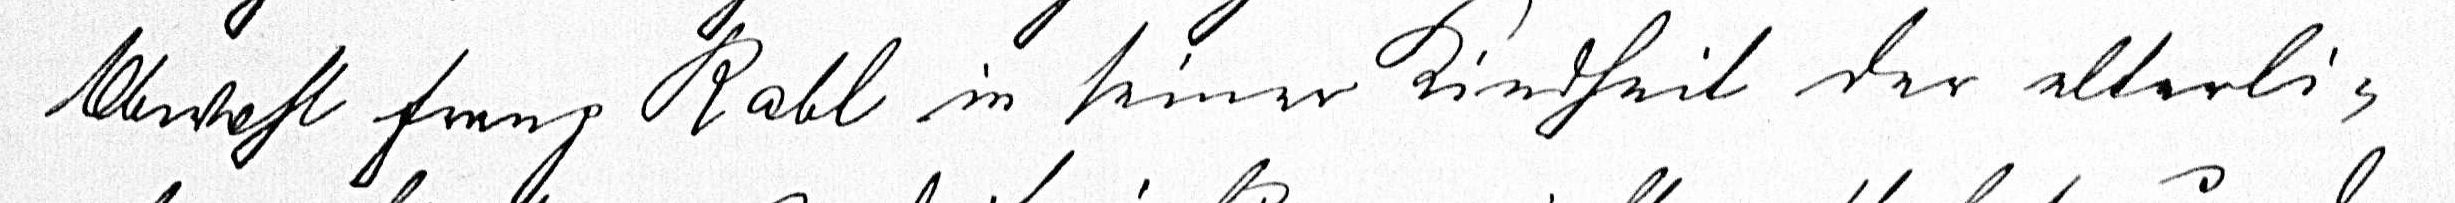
Obwohl Franz Rabl i seiner Kindheit der elterli¬
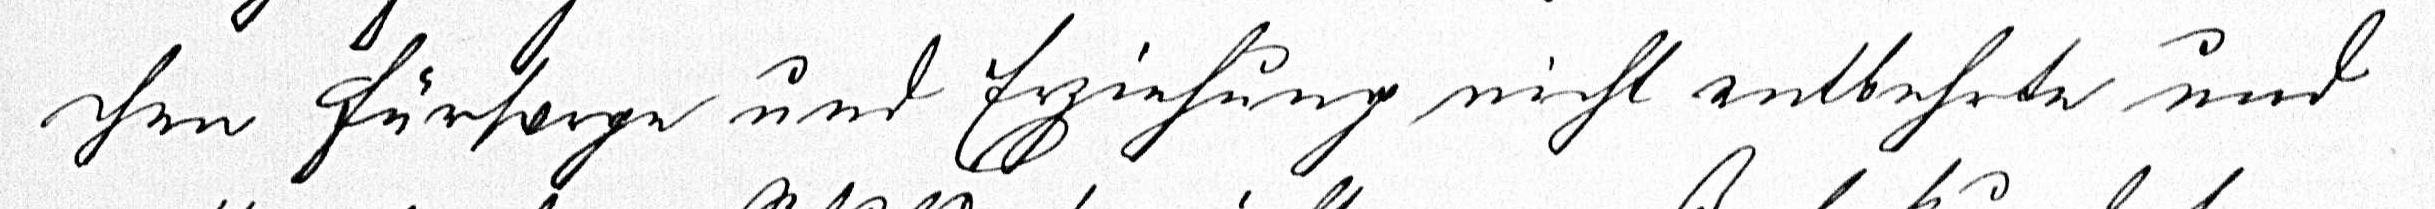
chen Fürsorge und Erziehung nicht entbehrte und
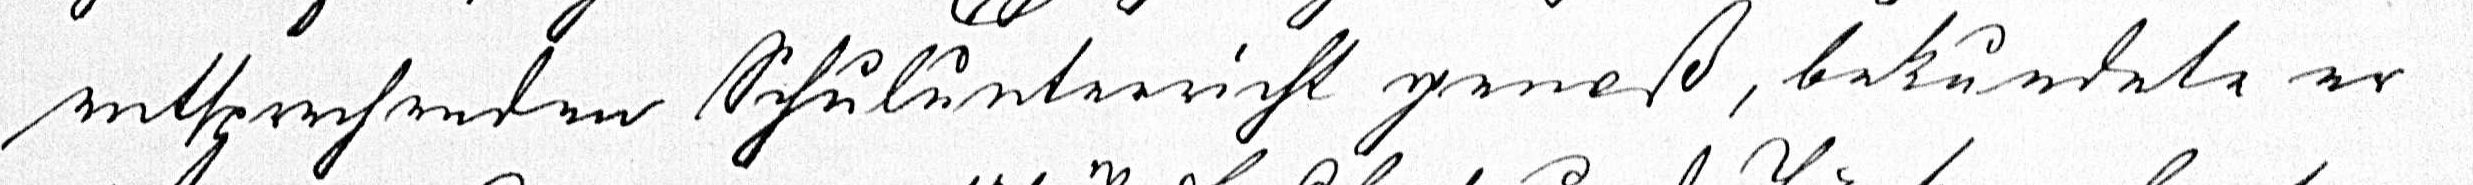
entsprechenden Schulunterricht genoß, bekundete er
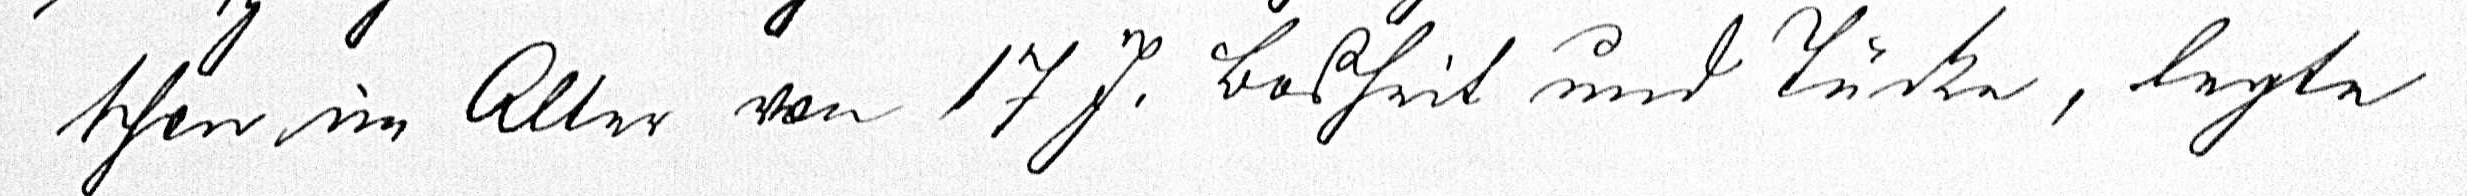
schon im Alter von 17 J. Bosheit und Tücke, legte
